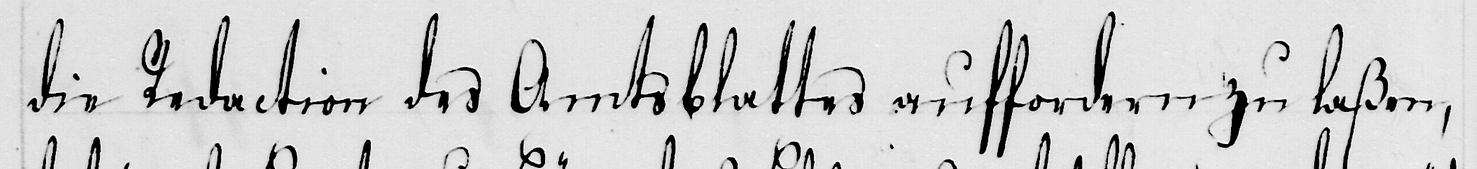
die Redaction des Amtsblattes auffordern zu laßen,
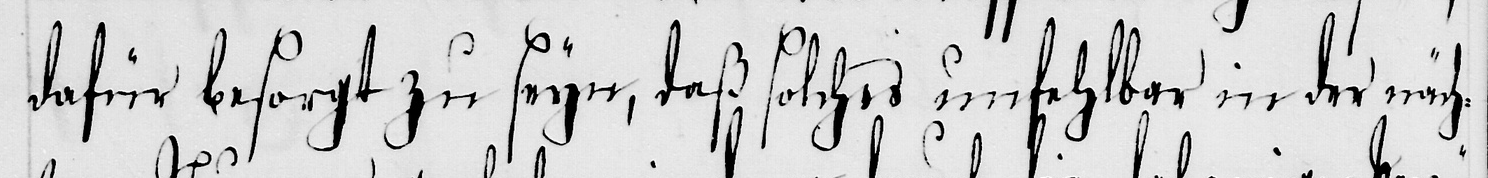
dafür besorgt zu seyn, daß solches unfehlbar in der näc¬
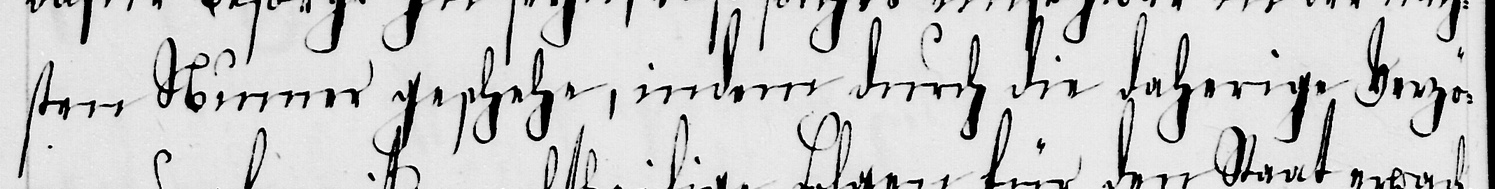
sten Num[m]er geschehe, indem durch die daherige Verzö¬
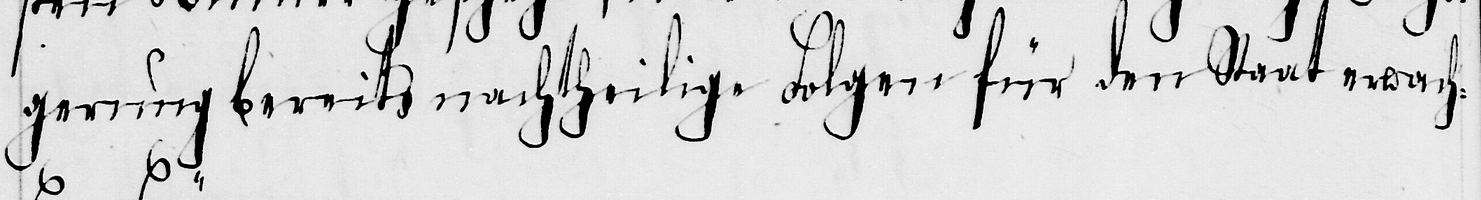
gerung bereits nachtheilige Folgen für den Staat erwach¬
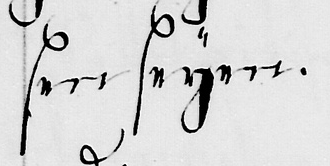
sen seyen.
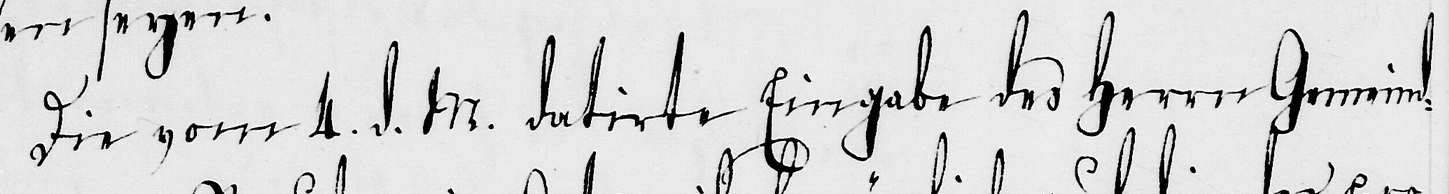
Die vom 4. d. M. datirte Eingabe des Herrn Gemeind¬
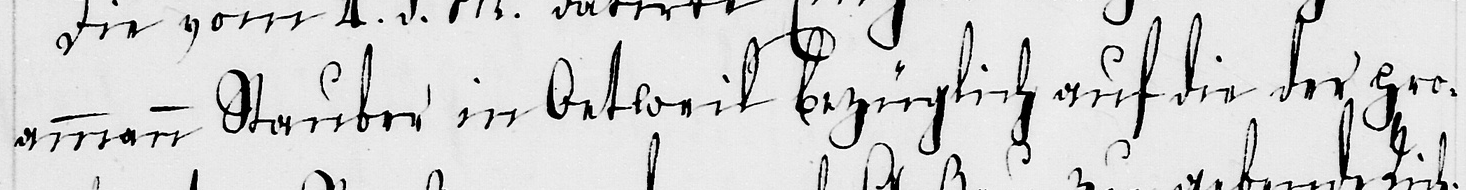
ammann Stauber in Oetweil bezüglich auf die der pro¬
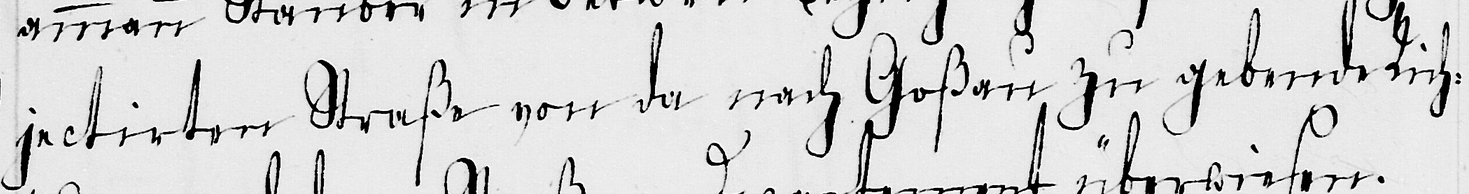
jectirten Straße von da nach Goßau zu gebende Rich¬
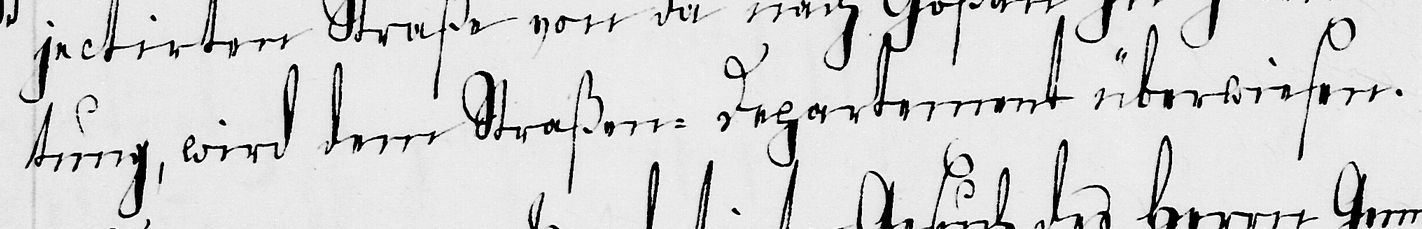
tung, wird dem Straßen-Departement überwiesen.
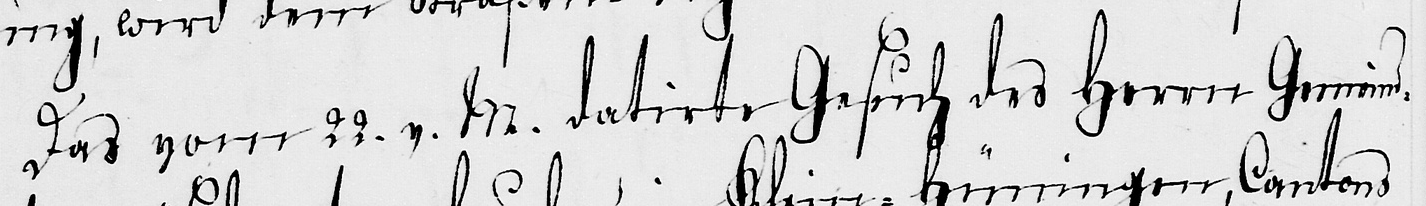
Das vom 22. v. M. datirte Gesuch des Herrn Gemein¬
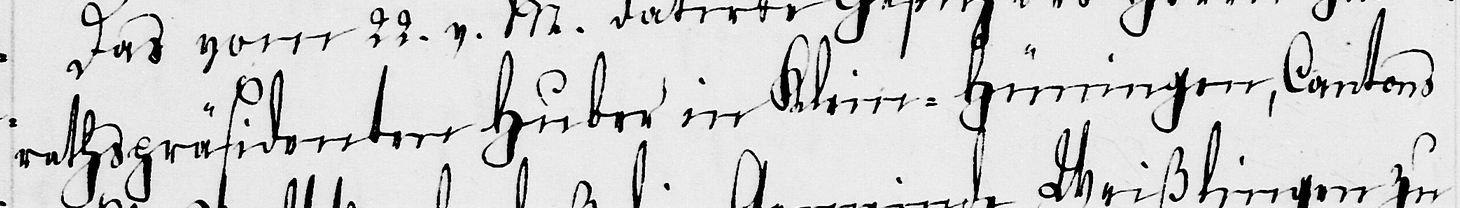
rathspräsidenten Huber in Klein-Hüningen, Cantons
